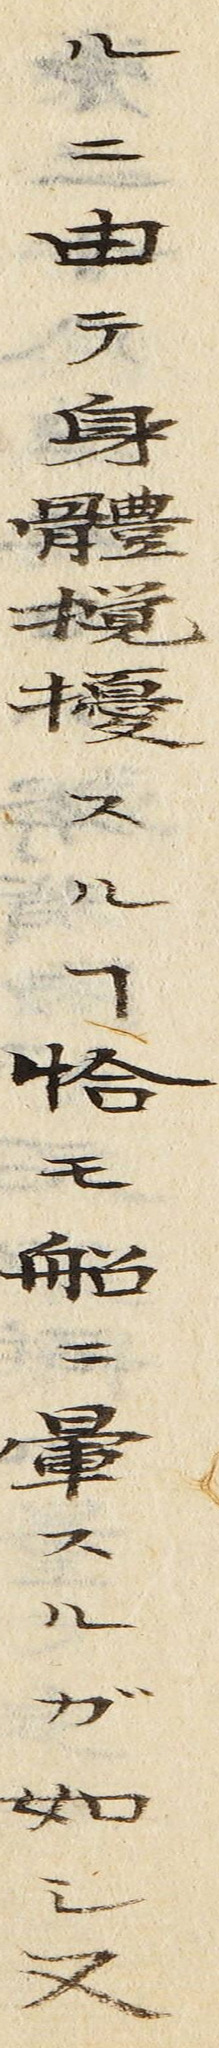ルニ由テ身体撹擾スルコト恰モ船ニ暈スルガ如シ又
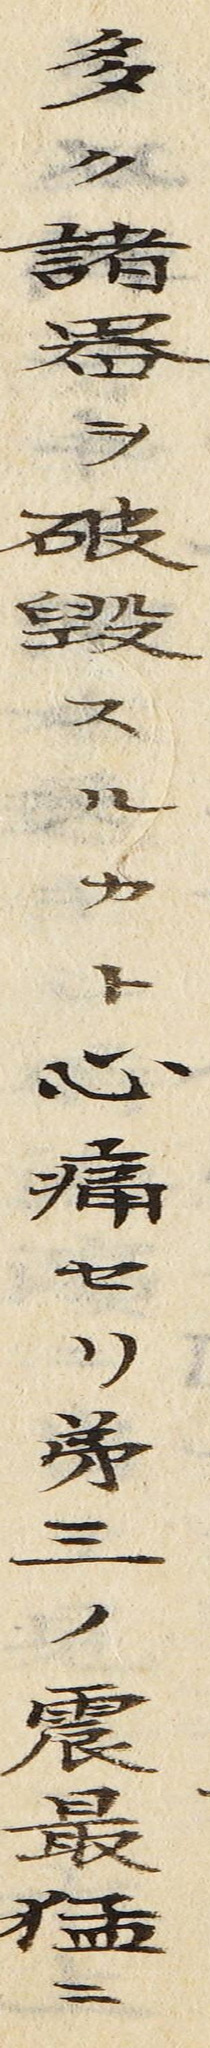多ク諸器ヲ破毀スルカト心痛セリ第三ノ震最猛ニ
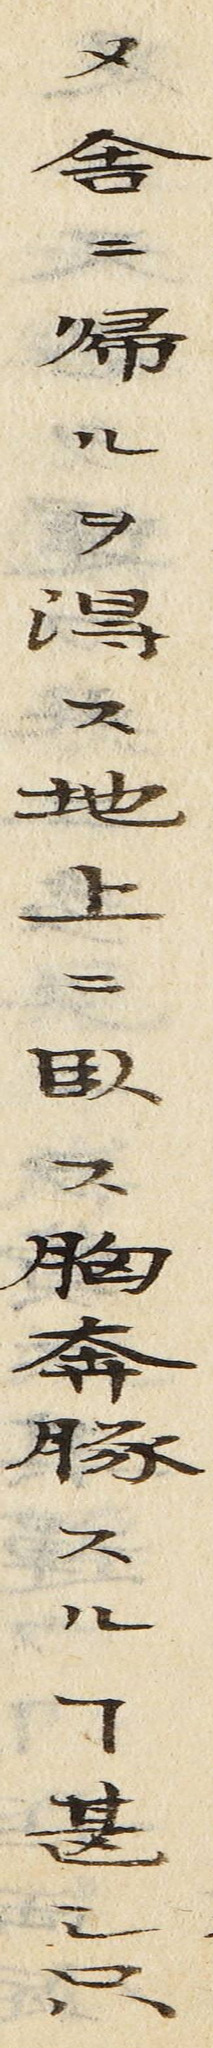シテ舎ニ帰ルヲ得ス地上ニ臥ス胸奔豚スルコト甚シ只
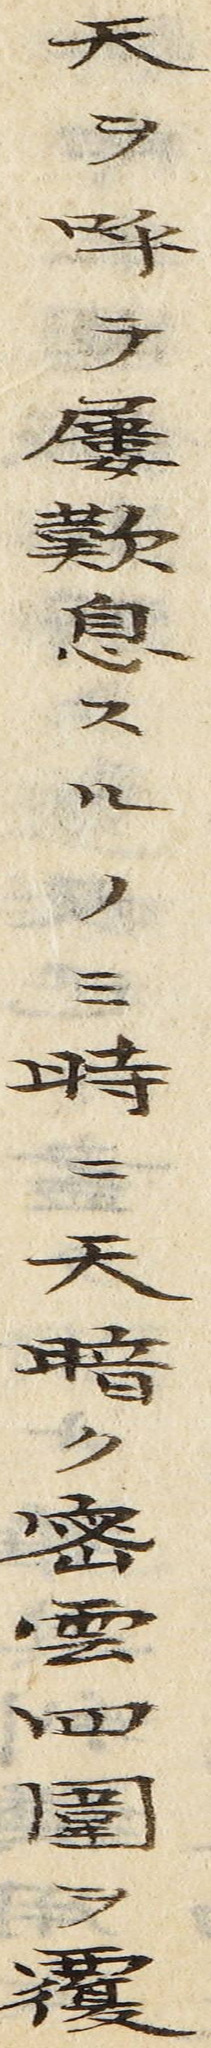天ヲ呼テ屡歎息スルノミ時ニ天暗ク密雲四囲ヲ覆
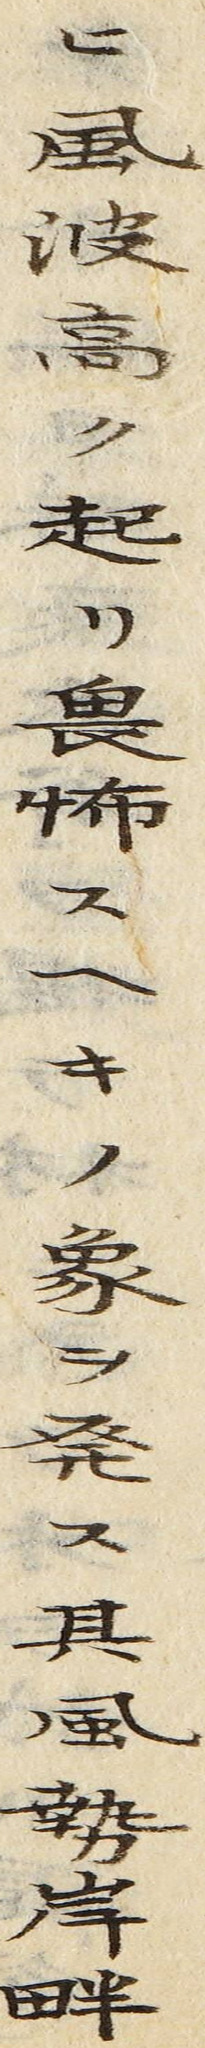ヒ風波高ク起リ畏怖スヘキノ象ヲ発ス其風勢岸畔
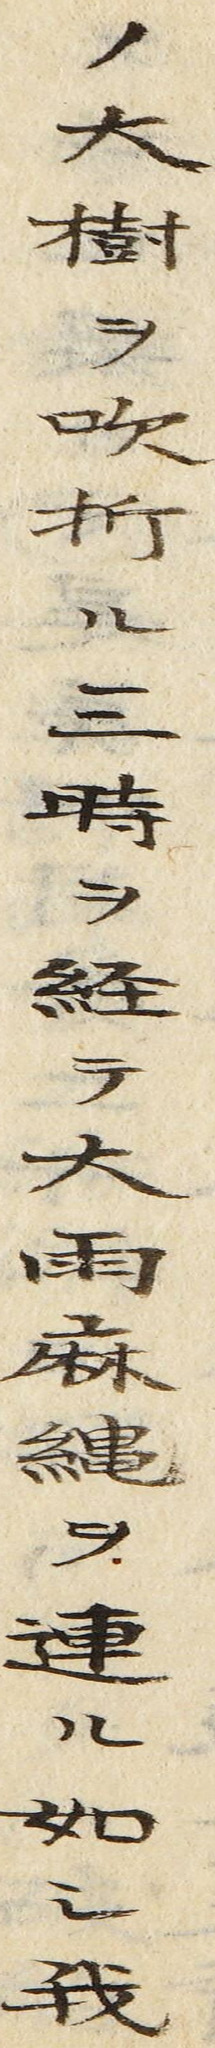ノ大樹ヲ吹折ル三時ヲ経テ大雨麻縄ヲ連ル如シ我
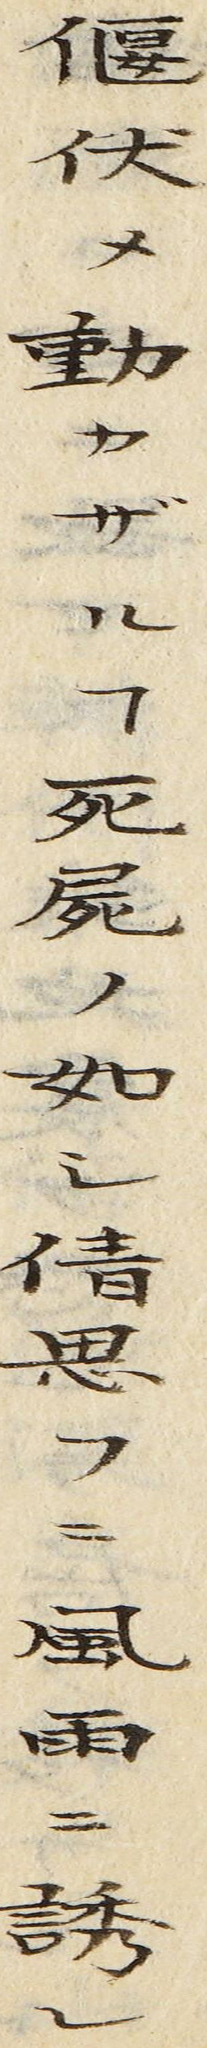偃伏シテ動カザルコト死屍ノ如シ倩思フニ風雨ニ誘レ
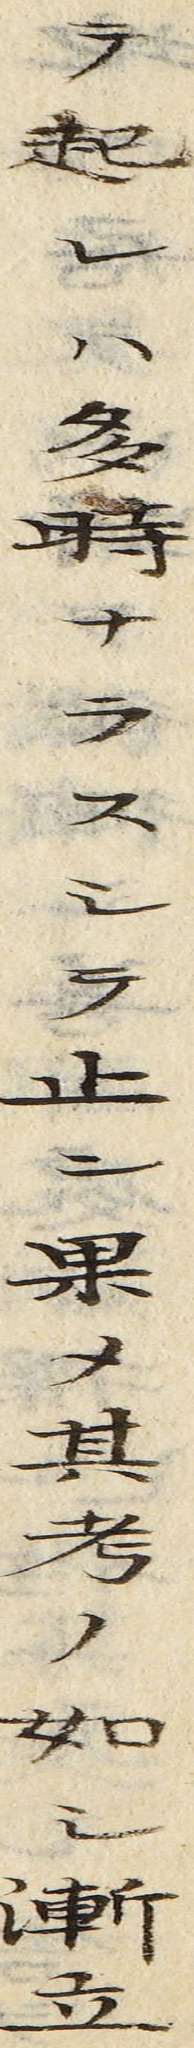テ起レハ多時ナラスシテ止ン果シテ其考ノ如シ漸立
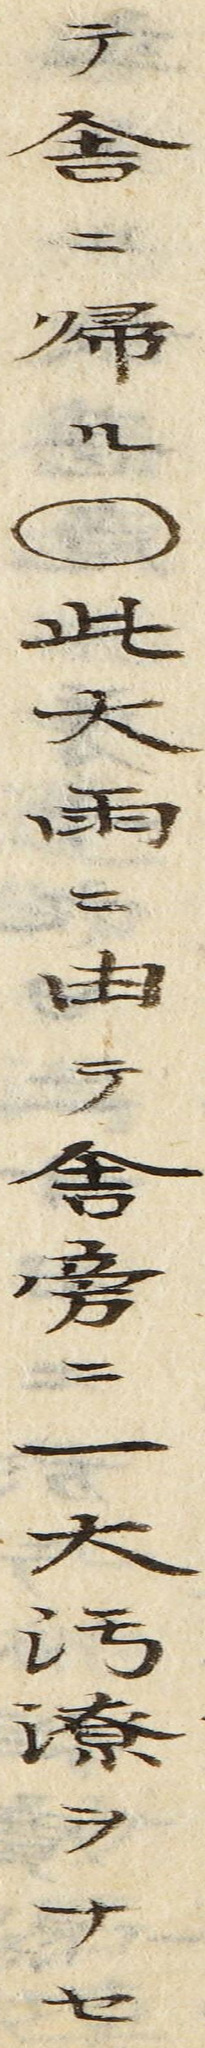テ舎ニ帰ル◯此大雨ニ由テ舎旁ニ一大汚潦ヲナセ
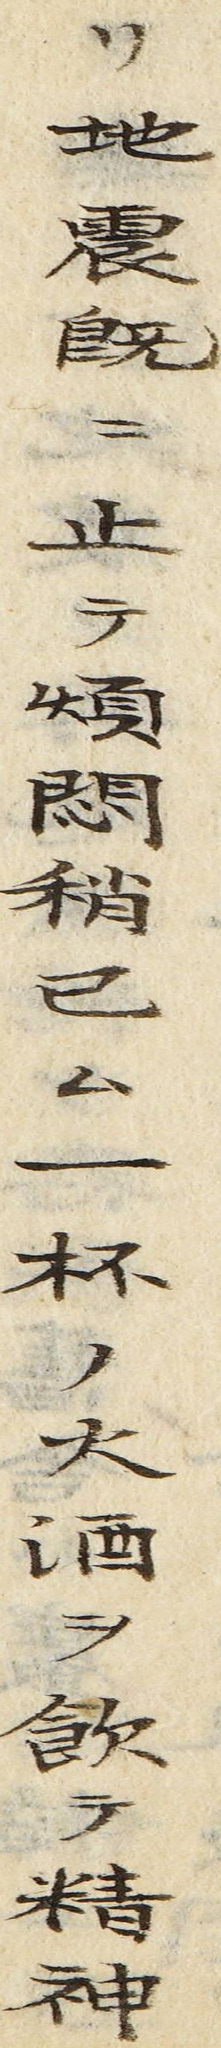リ地震既ニ止テ煩悶稍已ム一杯ノ火酒ヲ飲テ精神
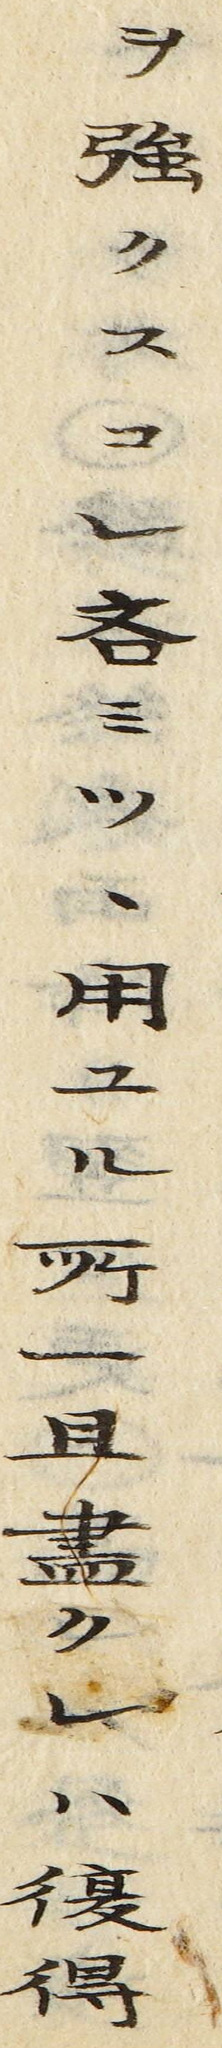ヲ強クスコレ吝ミツヽ用ユル所一旦尽クレハ復得

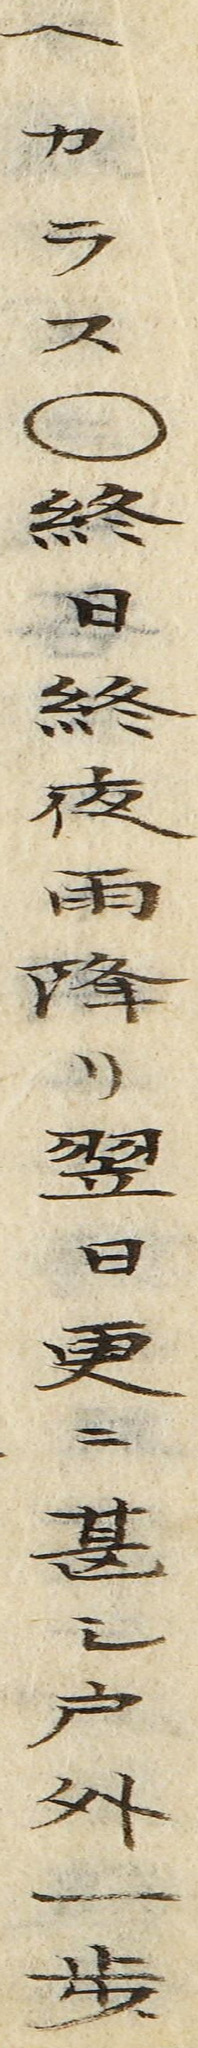ヘカラス◯終日終夜雨降リ翌日更ニ甚シ戸外一歩
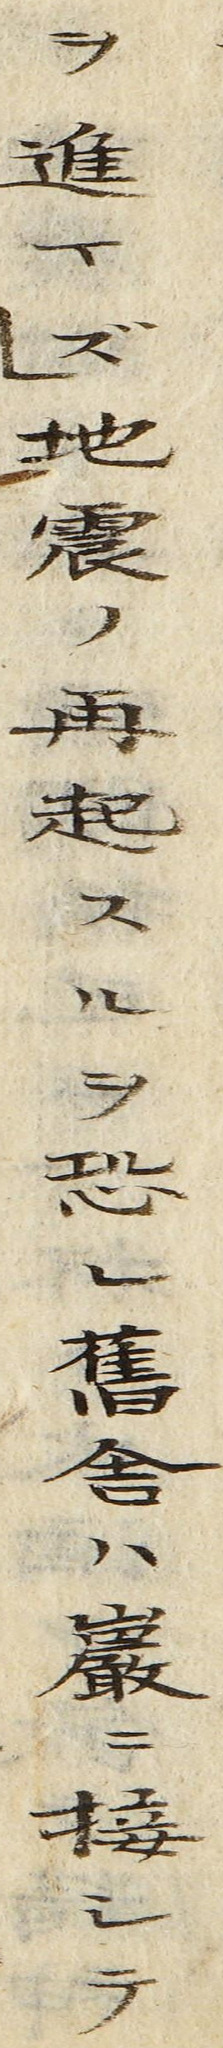ヲ進マズ」地震ノ再起スルヲ恐レ旧舎ハ巌ニ接シテ
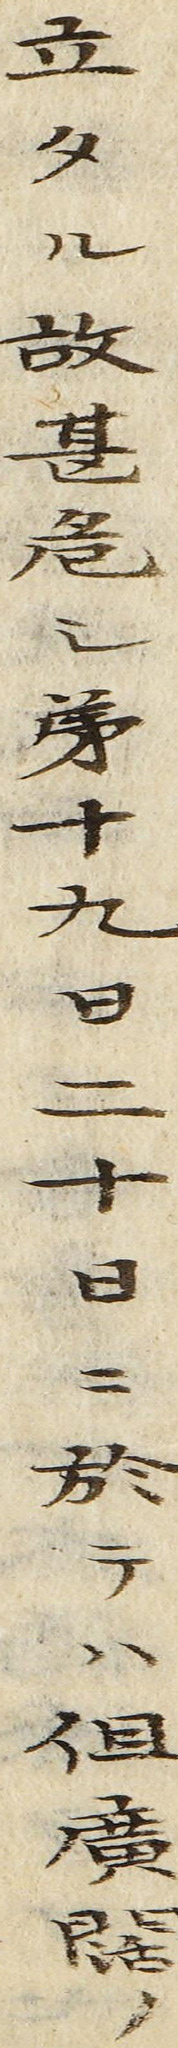立タル故甚危シ第十九日二十日ニ於テハ但広闊ノ
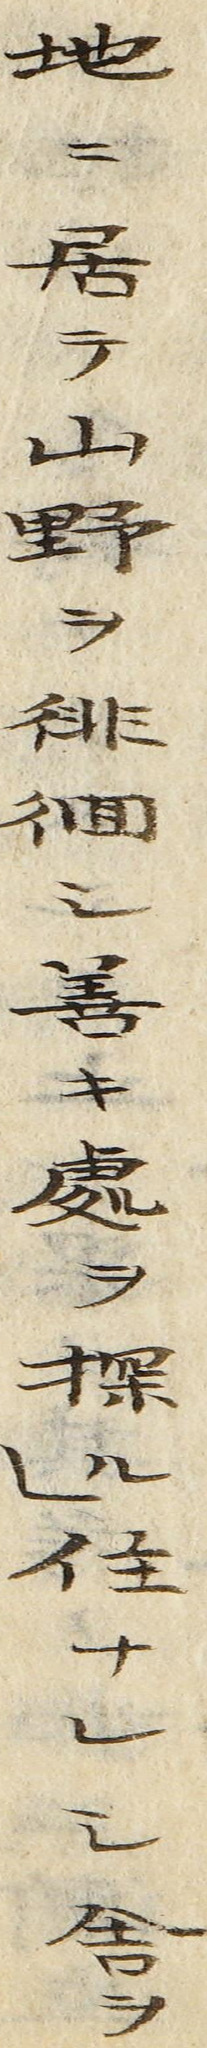地ニ居テ山野ヲ徘徊シ善キ処ヲ探ル」住ナレシ舎ヲ
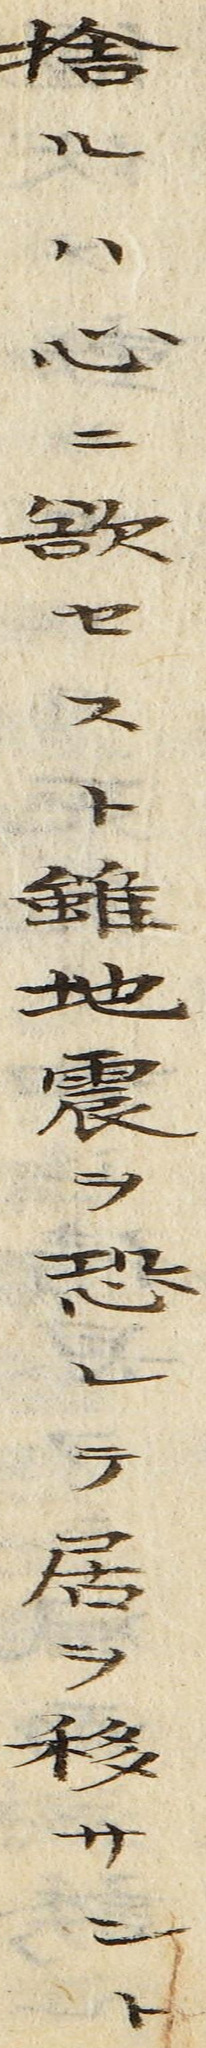捨ルハ心ニ欲セスト雖地震ヲ恐レテ居ヲ移サント
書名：漂流紀事
